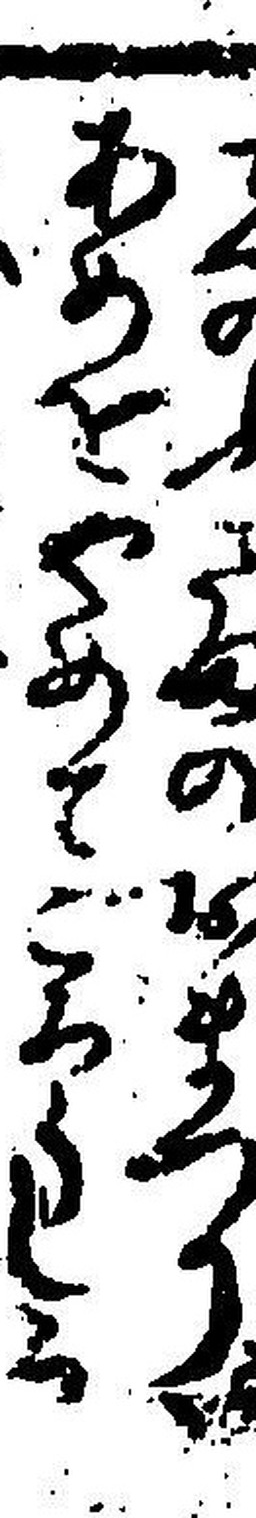あめをやめてごろうしろ
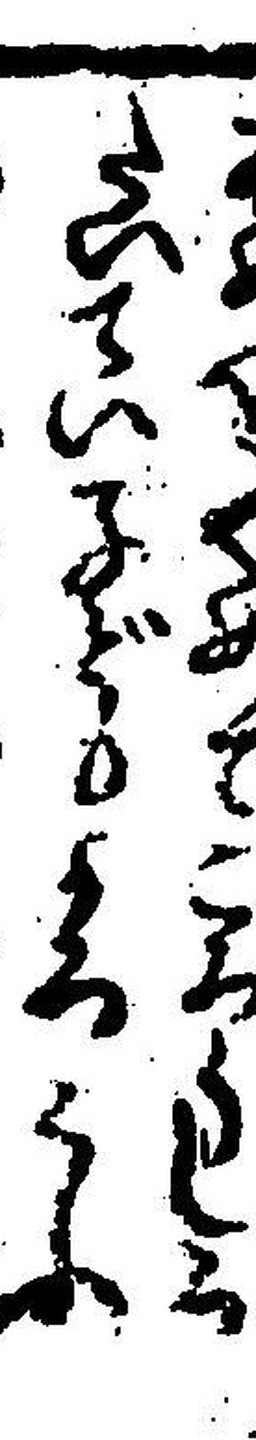たいてい子どもころこふ
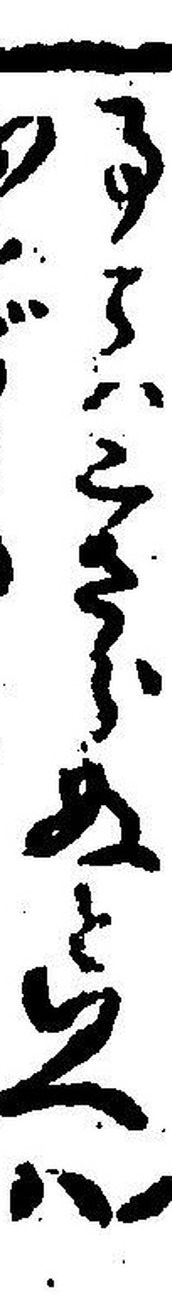事てはこさらぬといへは
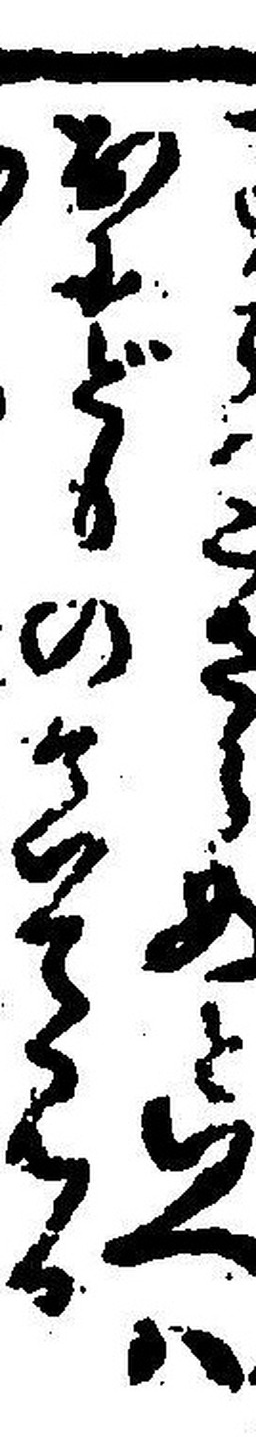おにどものそて見る
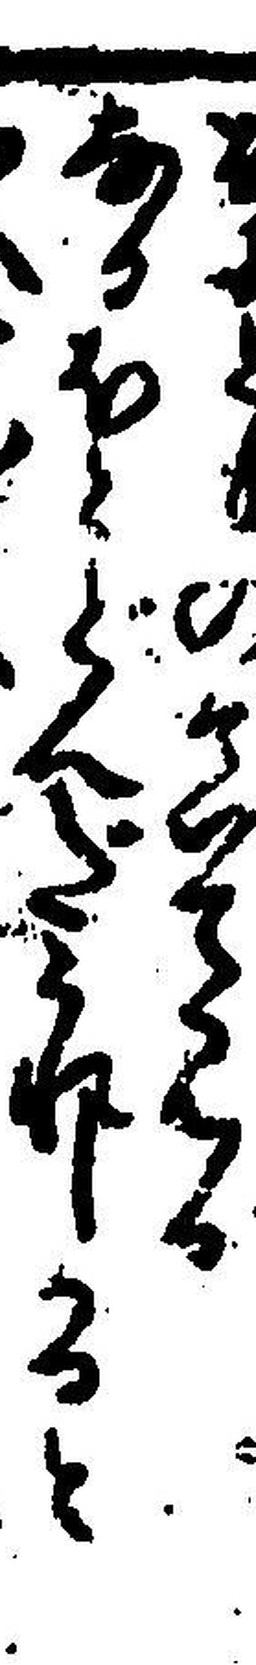なるほとどんだうれしかると
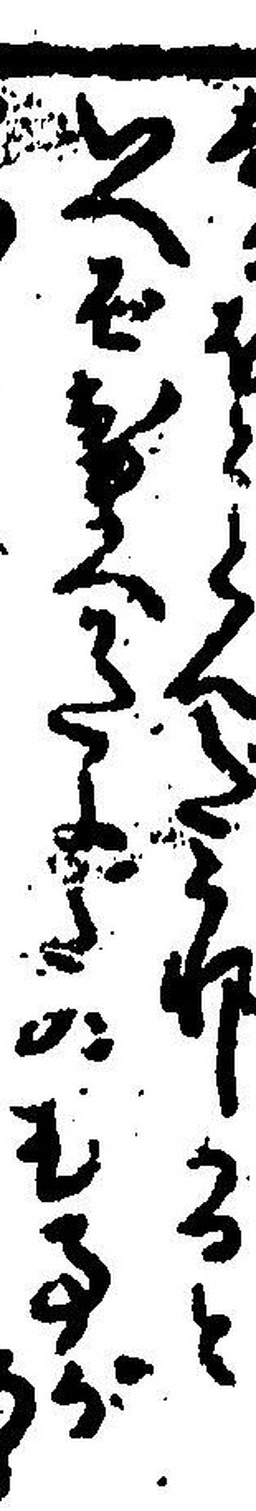いへばおまへかたにたのむ事が
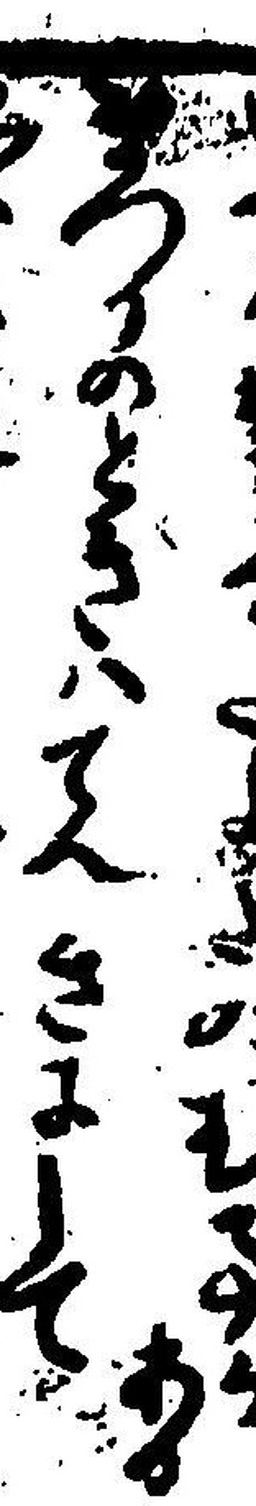まつりのときはてんきにして
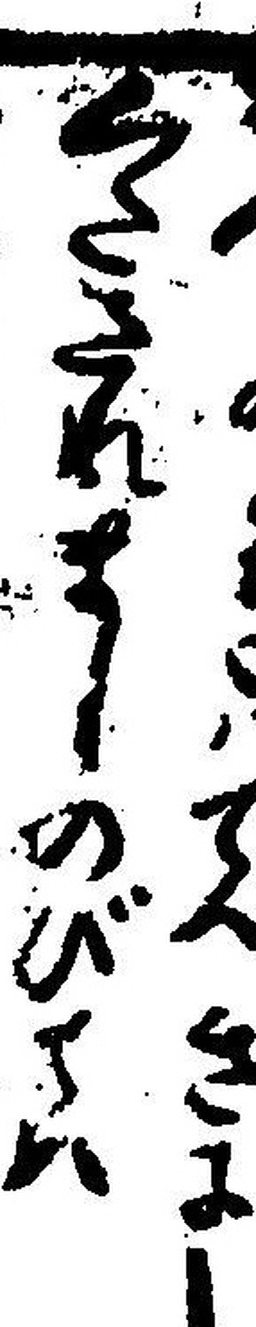くたされましのびては
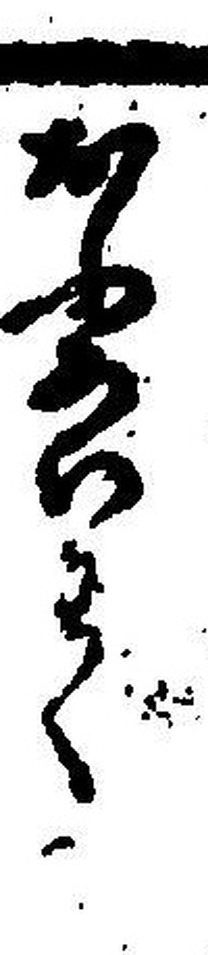おふめいわく
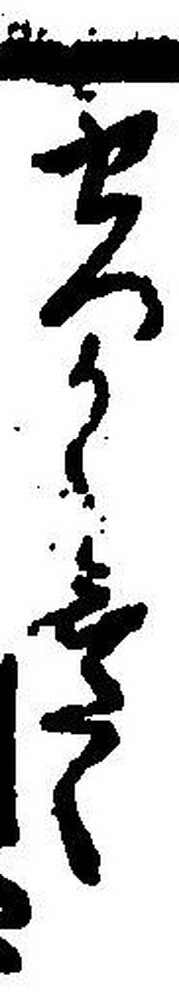せつかくしたく
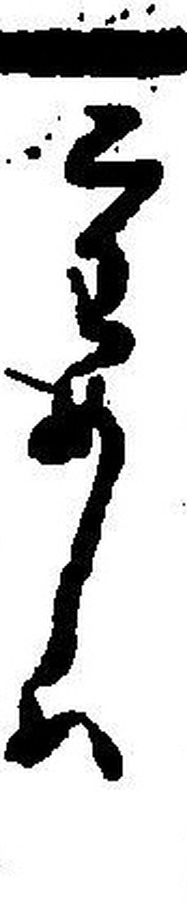こわめしは
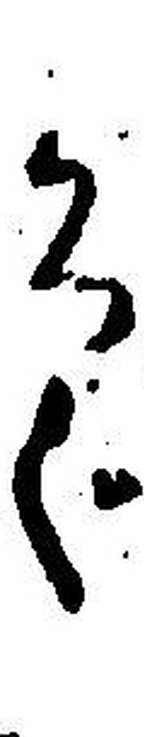かつ〴〵
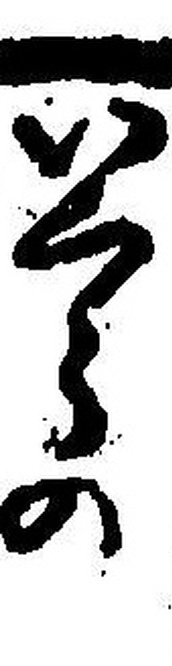いくらの
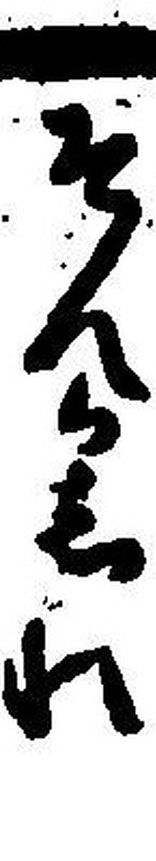そんかしれ
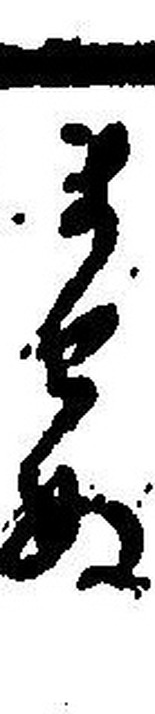ませぬ
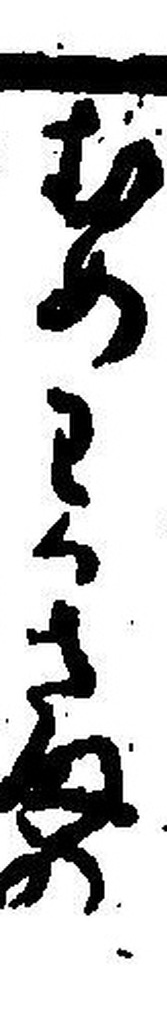むめわかさまの
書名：牡丹餅棚有 / 市場通笑作
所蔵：東京大学総合図書館 General Library in the University of Tokyo, JAPAN
